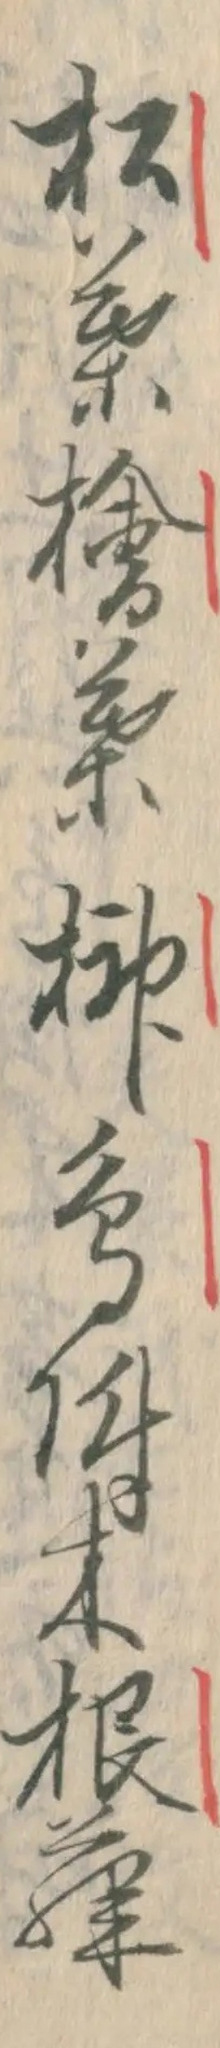松葉檜葉榊鳥附木根藤

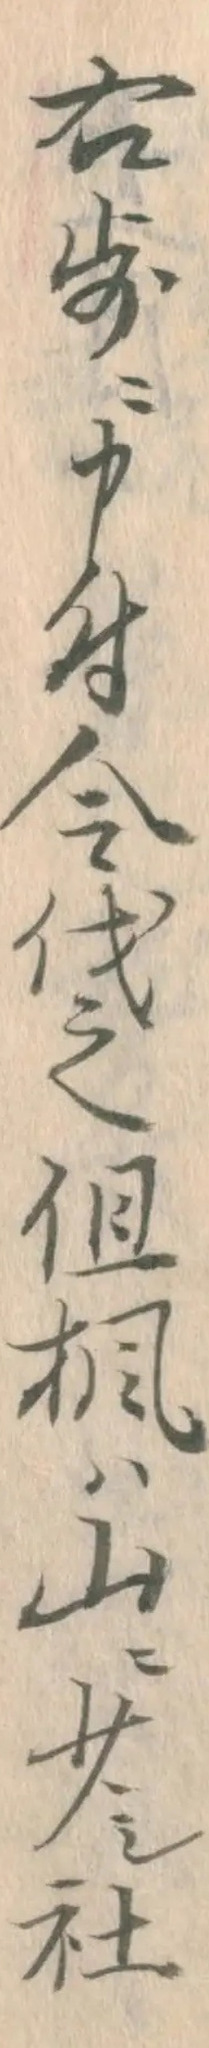右歩に申付令伐之但楓は山に少し社
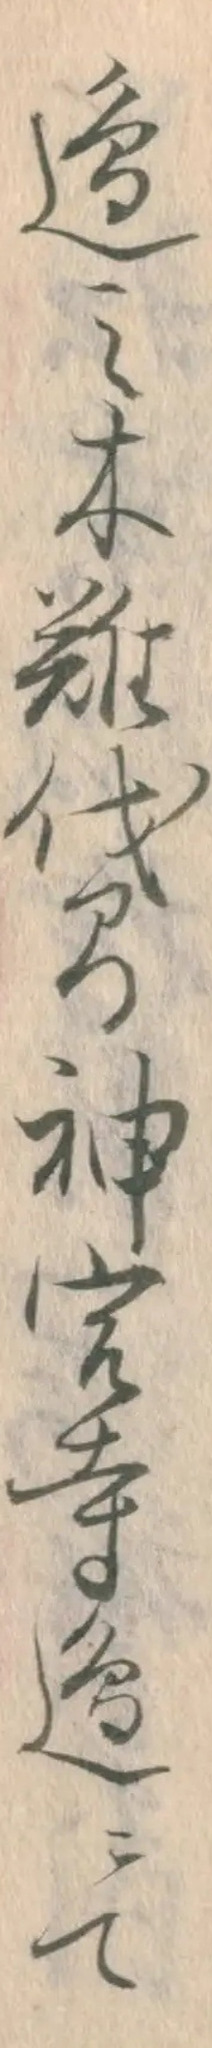辺之木難伐間神宮寺辺ニて
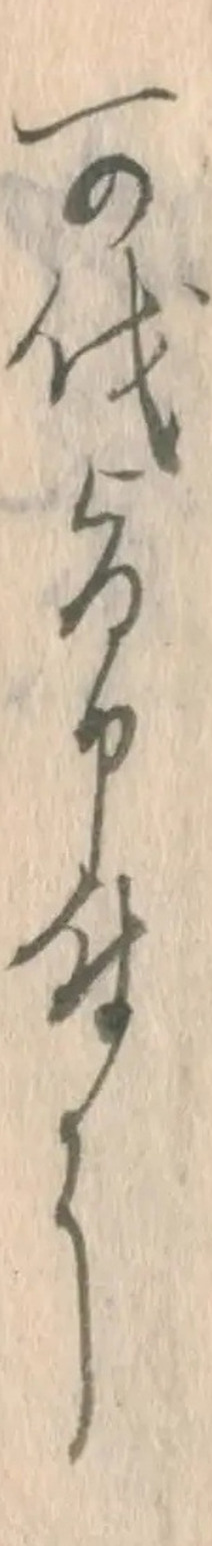可伐旨申付了
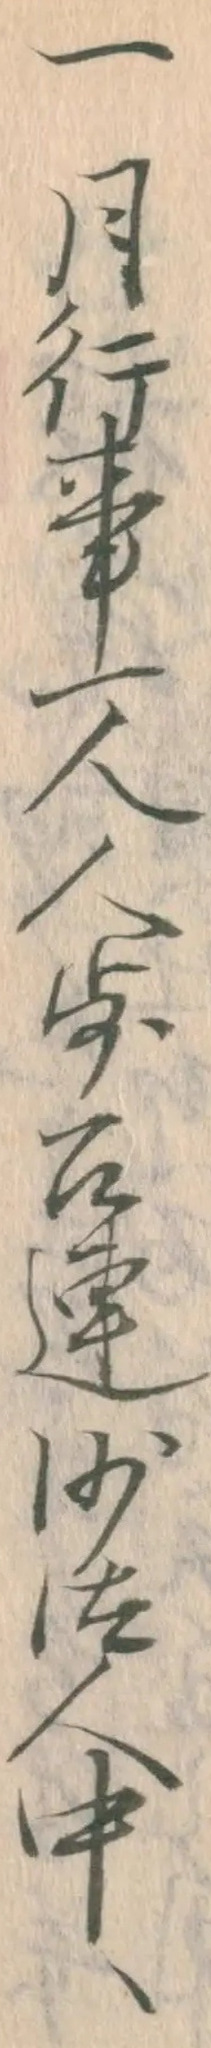一月行事一人人歩召連沙汰人中へ
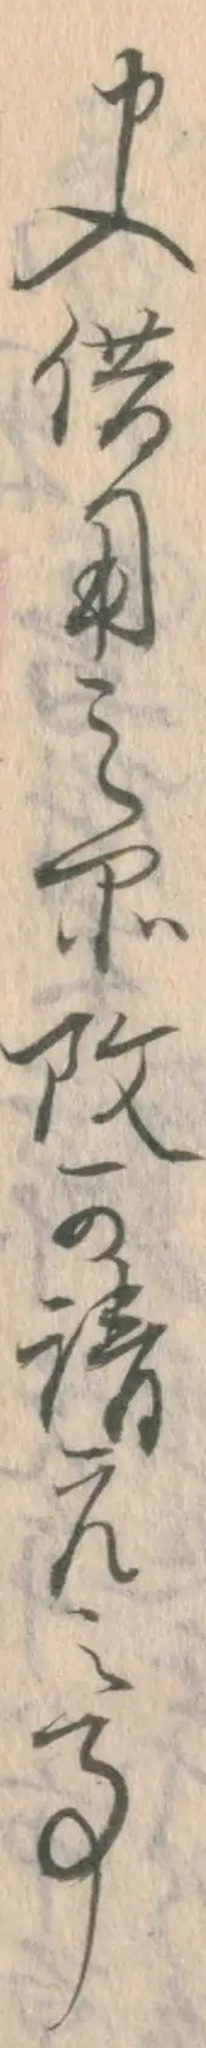申入借用之品改可請取之事
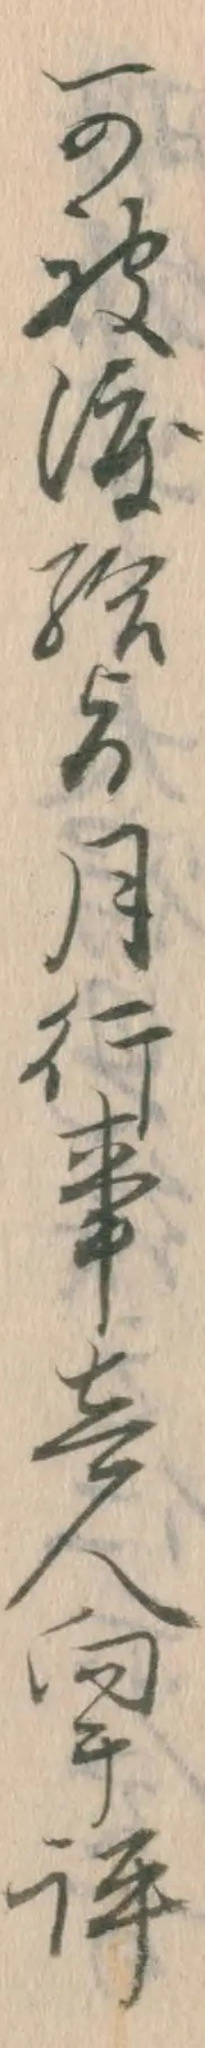可被渡給旨月行事壱人向于評
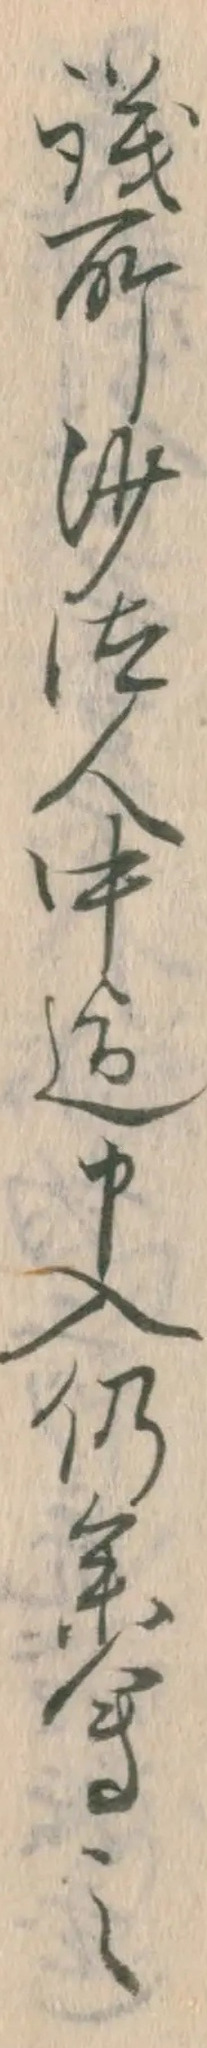議所沙汰人中迄申入仍参会之
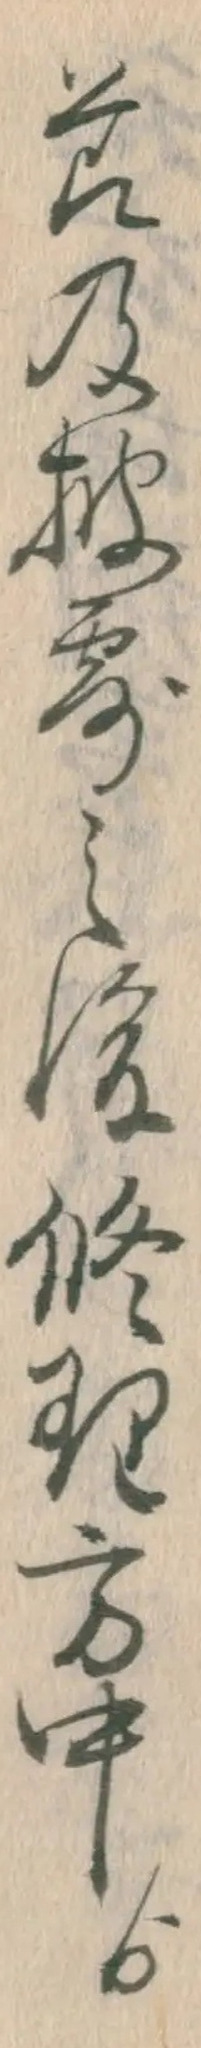節及披露之後修理方中ゟ
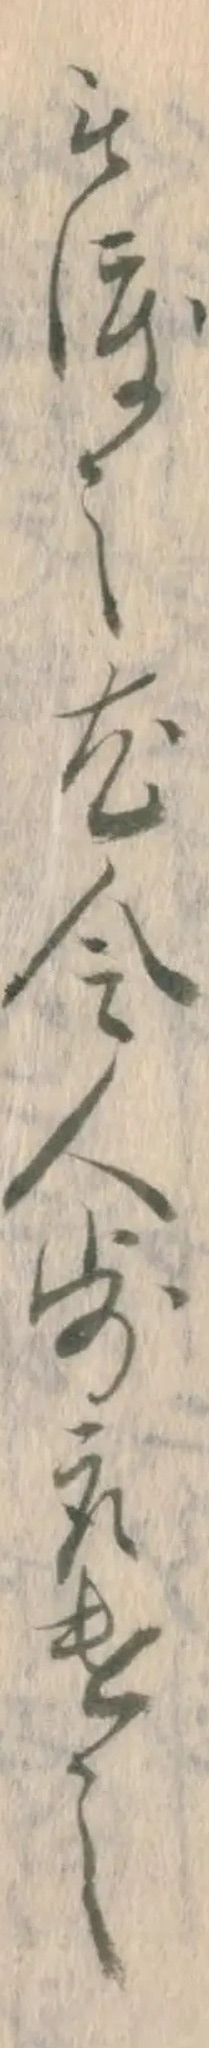被渡之尤令人歩取遣之
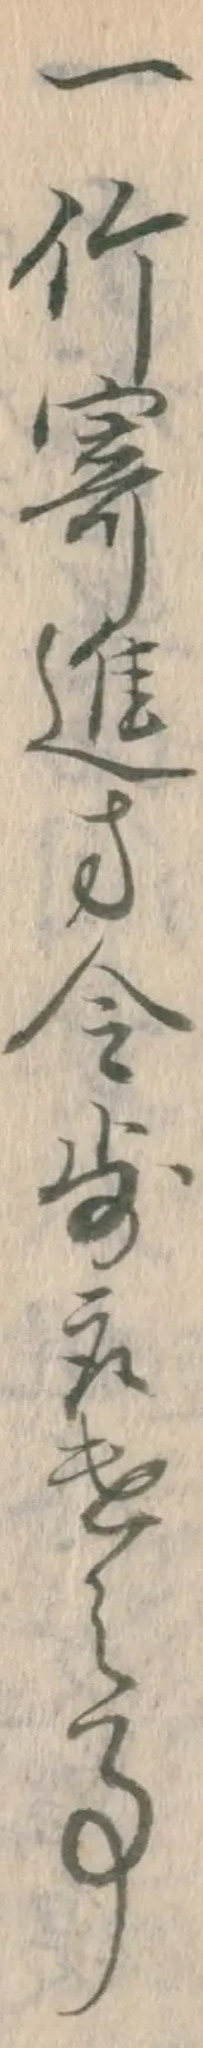一竹寄進方令歩取遣之事
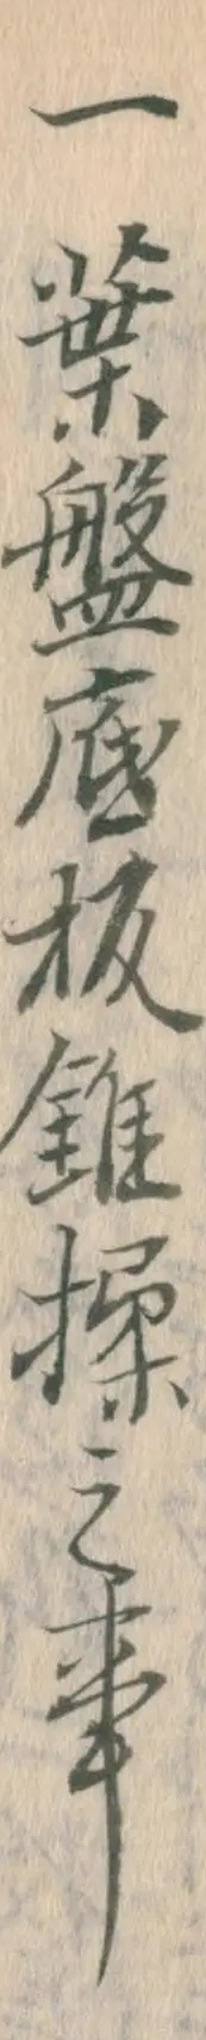一葉盤底板錐操之事
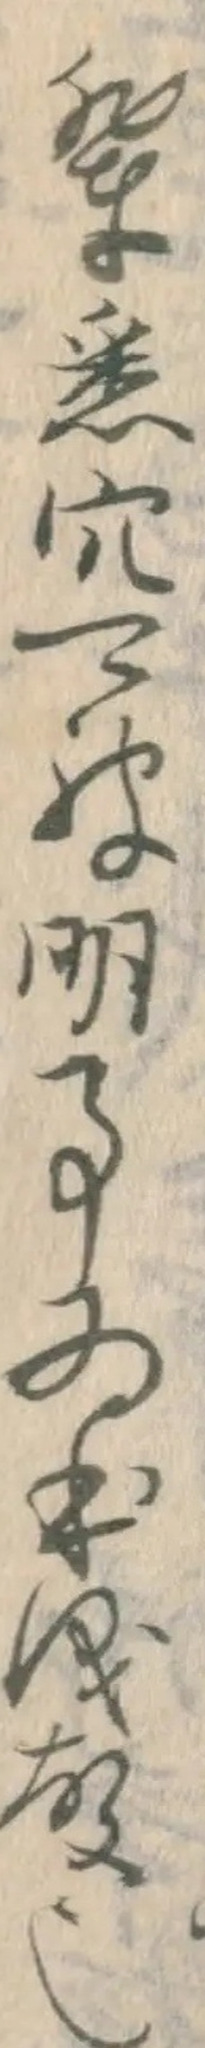輩悉穴可被明事為本儀故也

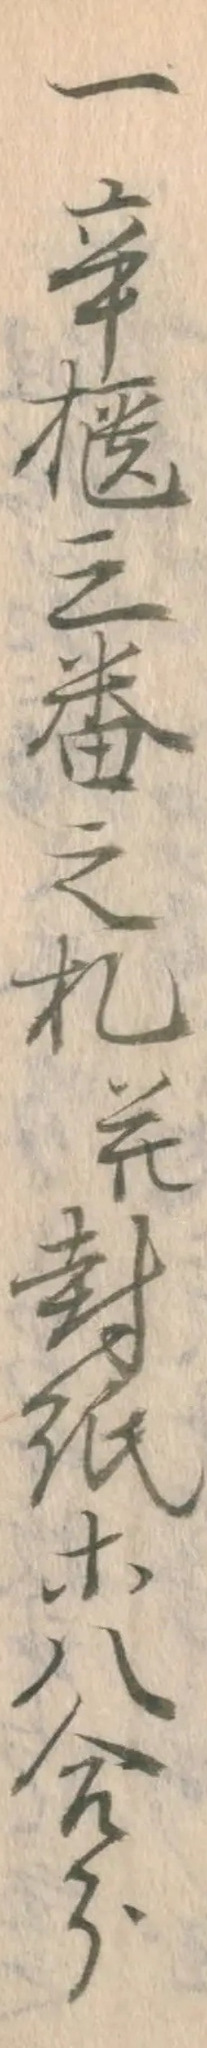一辛櫃三番之札并封紙等八合分
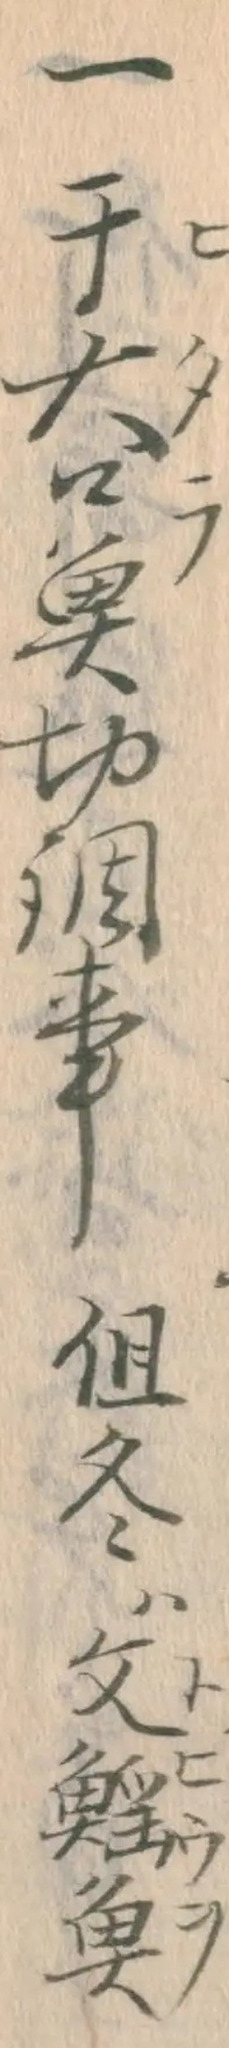一干大口魚切調事但冬は文鰩魚
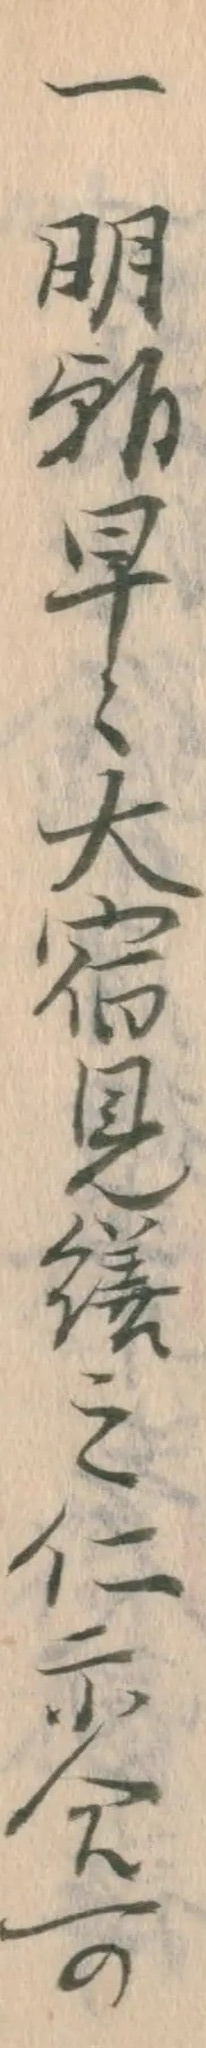一明朝早々大宿見繕之仁示合可
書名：賀茂社記録. 第81冊
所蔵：国立国会図書館 National Diet Library, JAPAN
